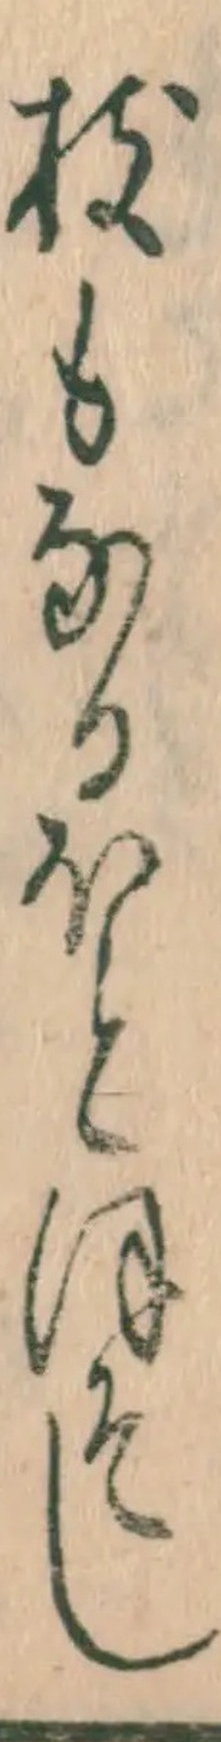枝もなるほとほそし
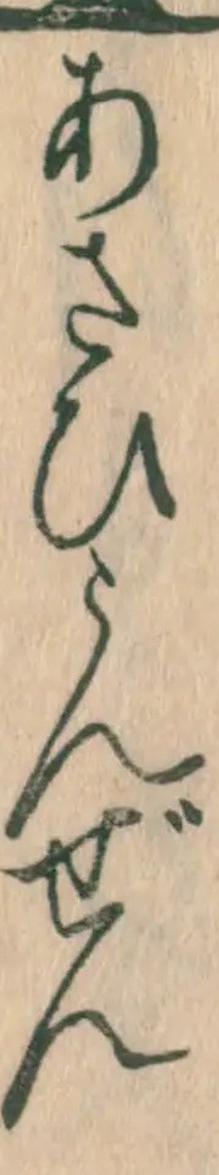▲あさひうんぜん
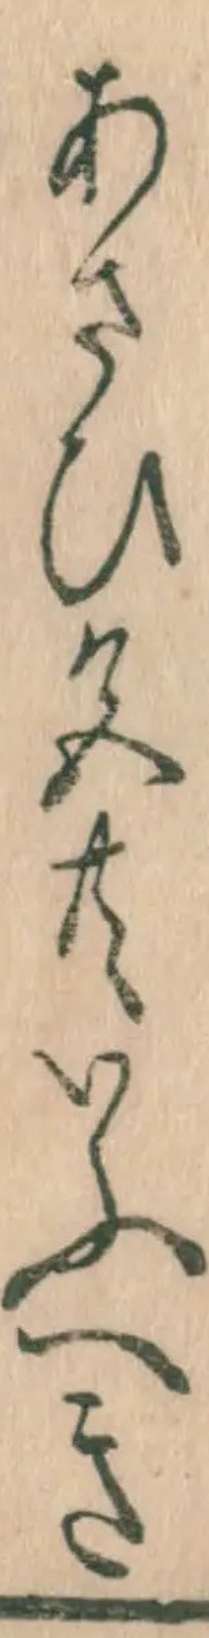あさひ色共いふへき
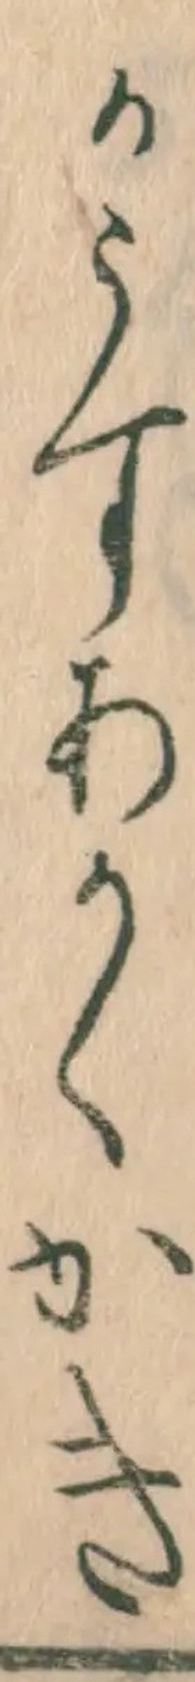かうすあかくかき
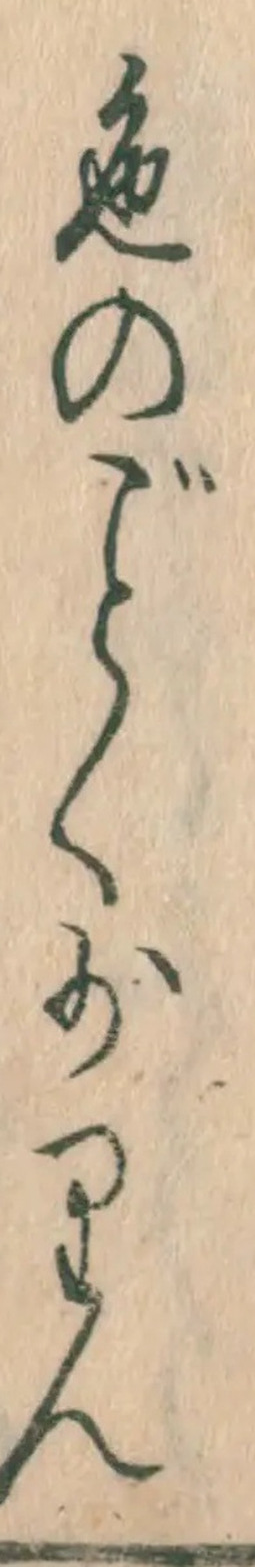色のごとく少りん
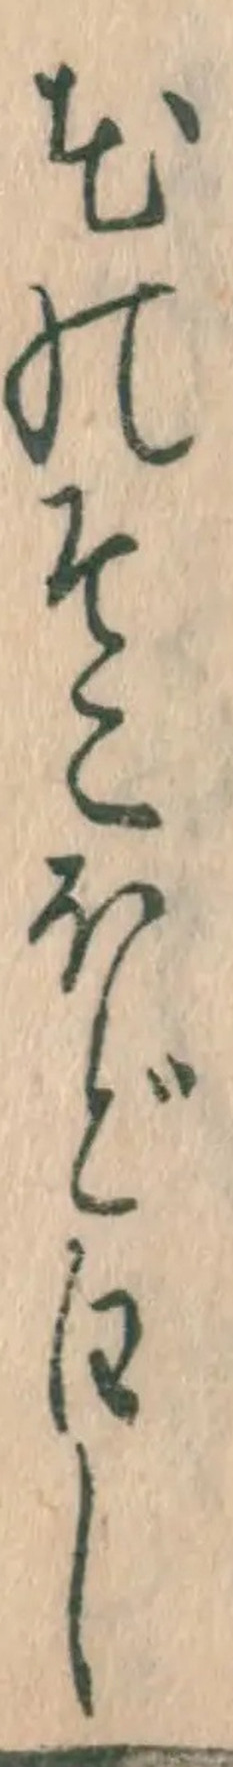花のそこほど白し
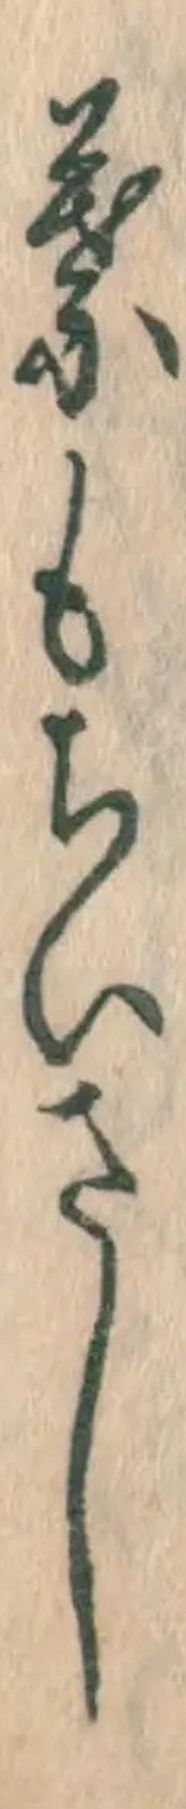葉もちいさし

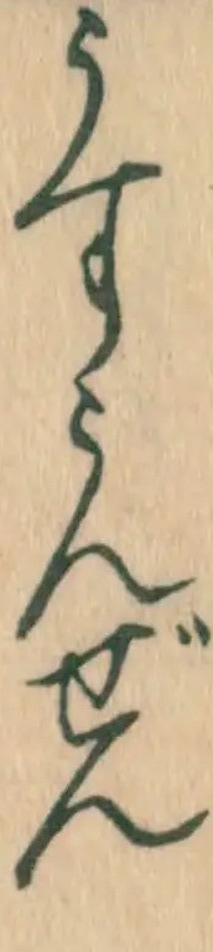うすうんぜん
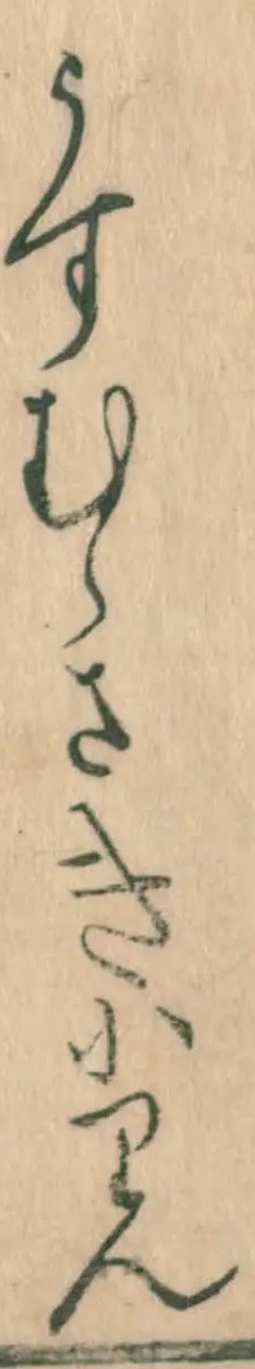うすむらさき小りん
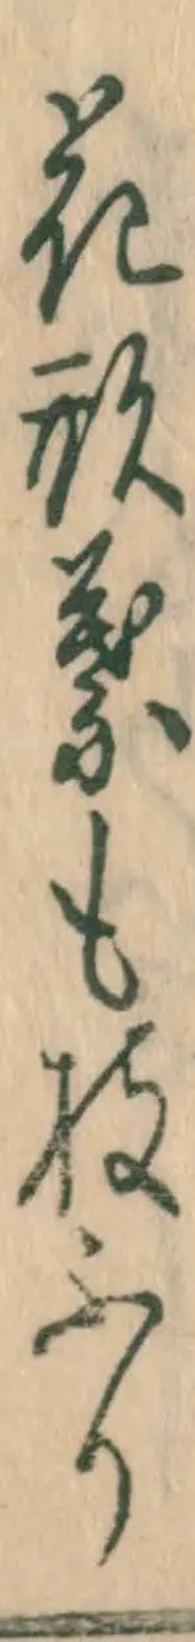花形葉も枝ふり
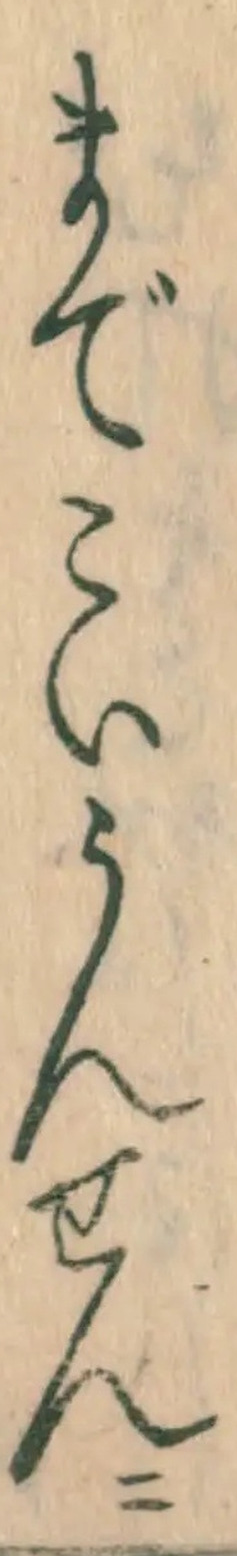までこいうんせんに
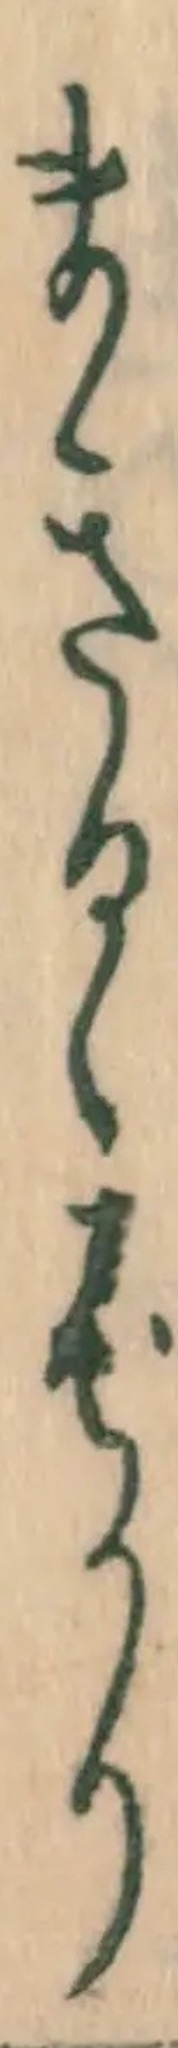まきるゝばかり
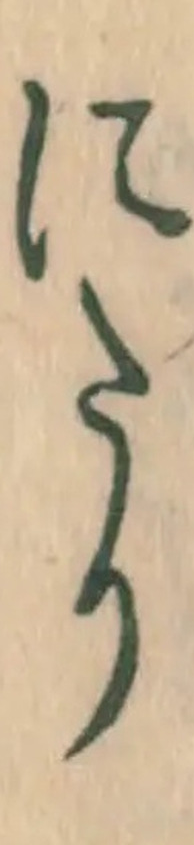にたり
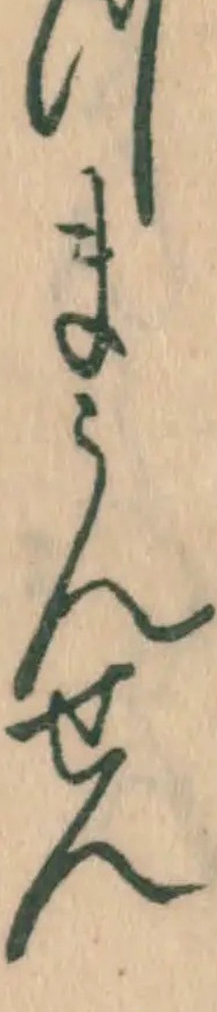さつまうんせん
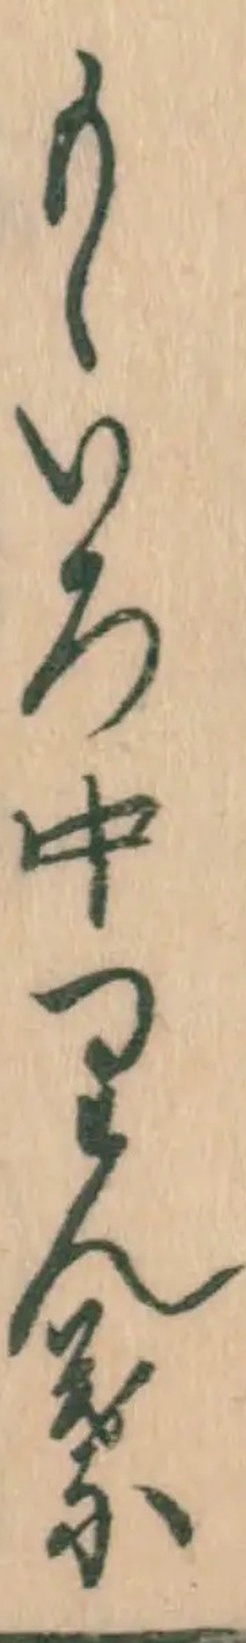もゝいろ中りん葉
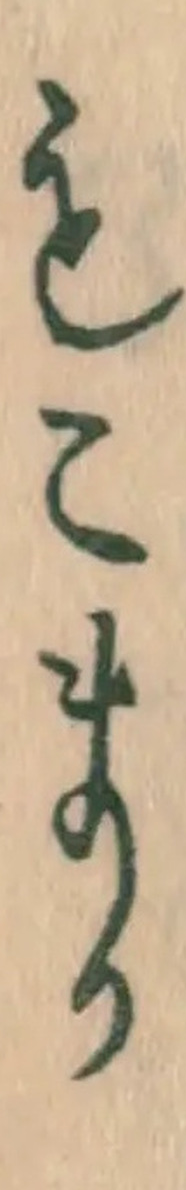もこまか
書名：錦繍枕 5巻. [2]
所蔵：国立国会図書館 National Diet Library, JAPAN
